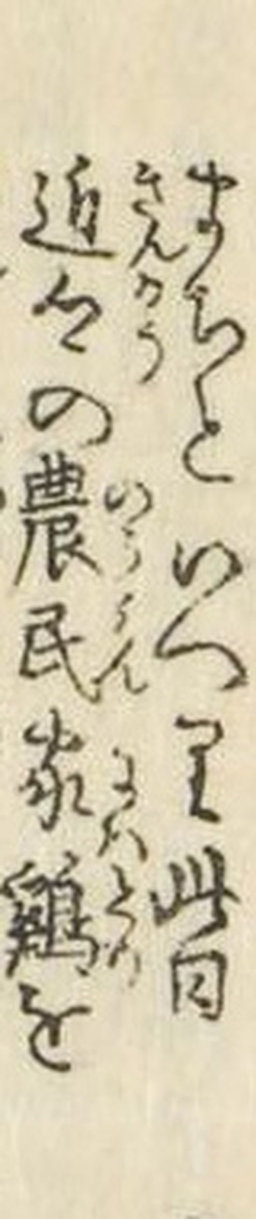近郷の農民家鶏を
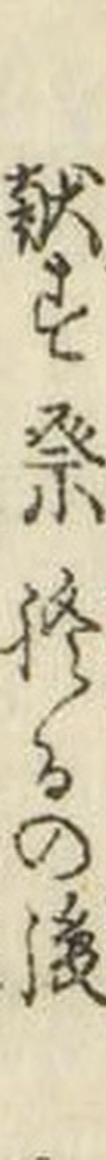献す祭終るの後
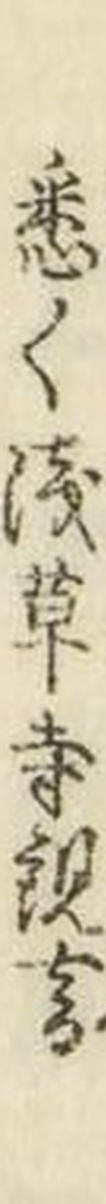悉く浅草寺観音
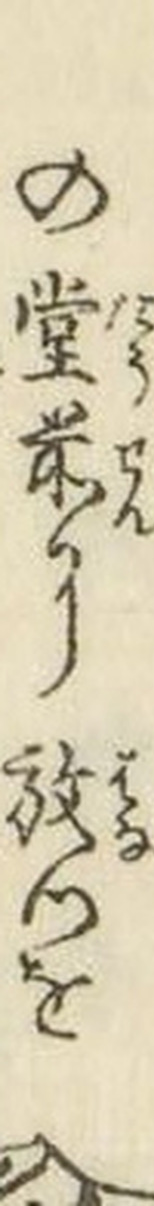の堂前に放つを

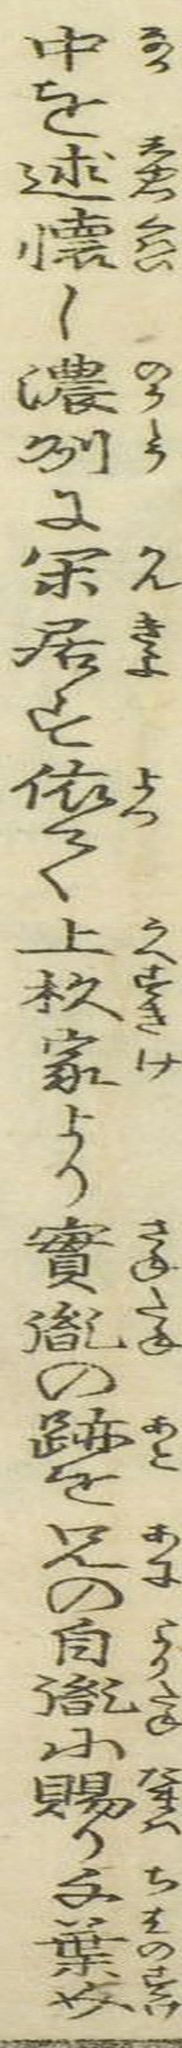中を述懐し濃州に閑居す依て上杉家より実胤の跡を兄の自胤に賜り千葉介
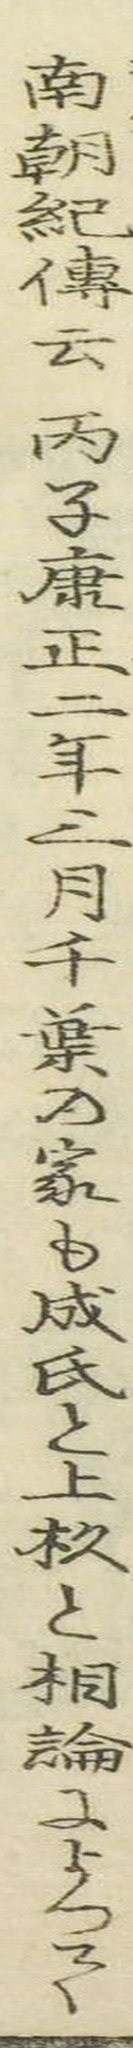南朝紀伝云丙子康正二年三月千葉の家も成氏と上杉と相論によつて
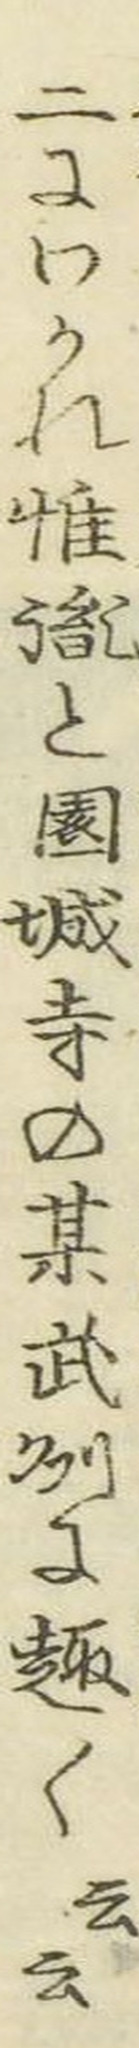二にわかれ惟胤と園城寺の某武州に趣く云云
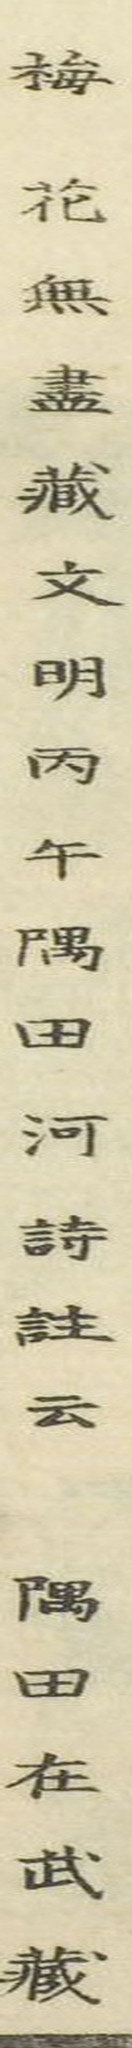梅花無盡蔵文明丙午隅田河詩註云隅田在武蔵
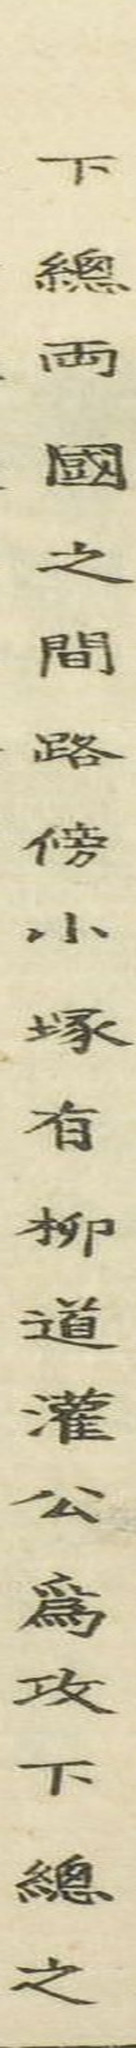下総両国之間路傍小塚有柳道灌公為攻下総之
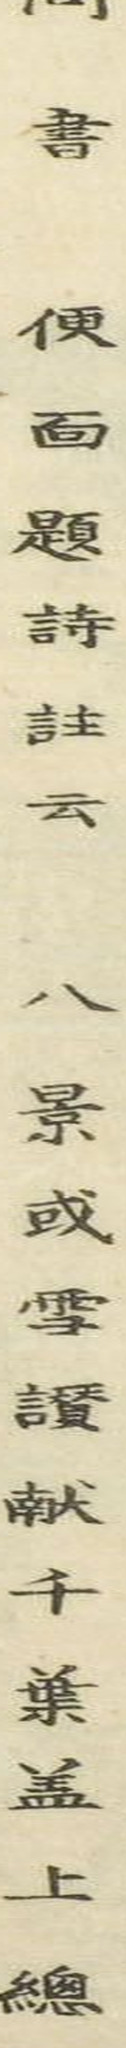同書便面題詩註云八景或雪讃献千葉蓋上総
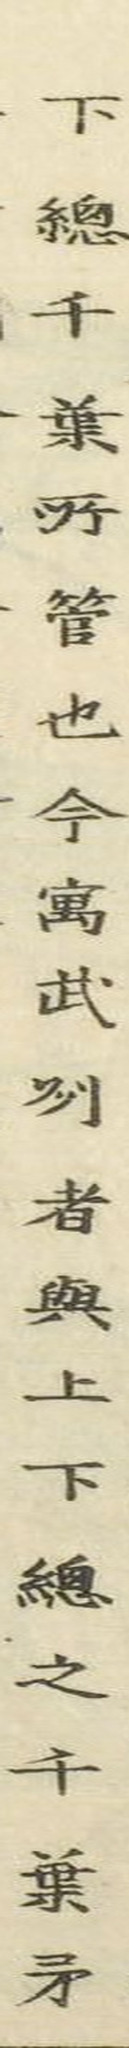下総千葉所管也今寓武州者与上下総之千葉矛
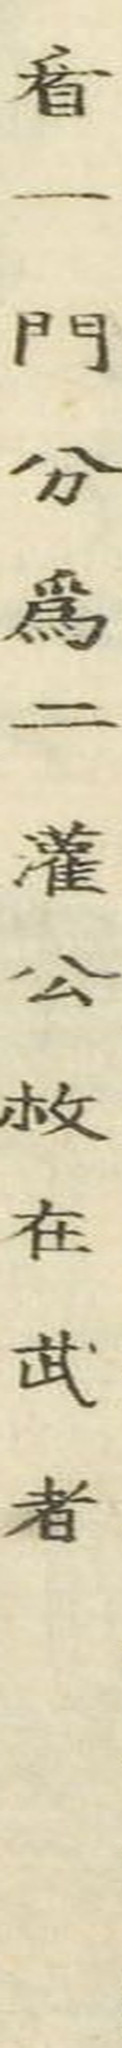盾一門分為二灌公在武者
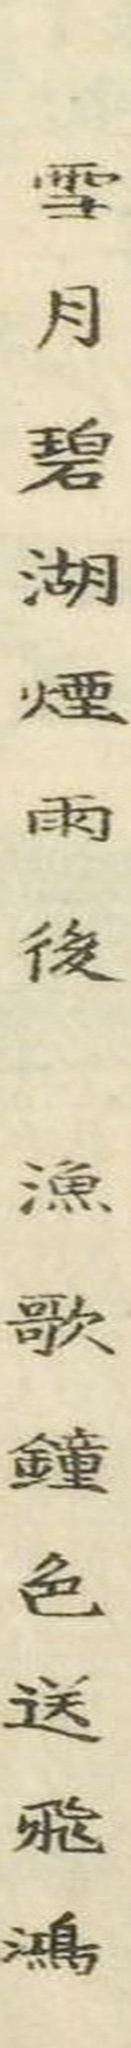雪月碧湖煙雨後漁歌鐘色送飛鴻
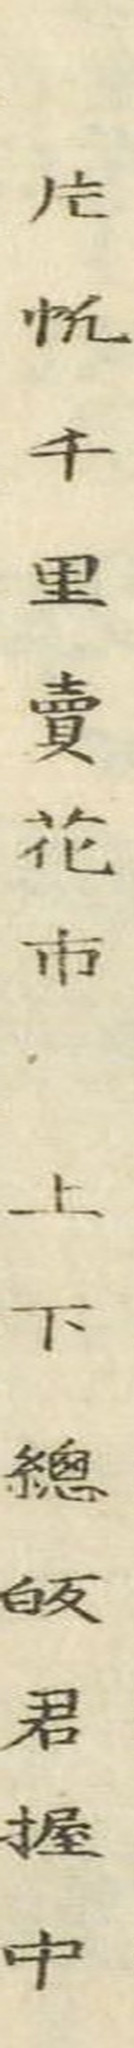片帆千里売花市上下総帰君握中
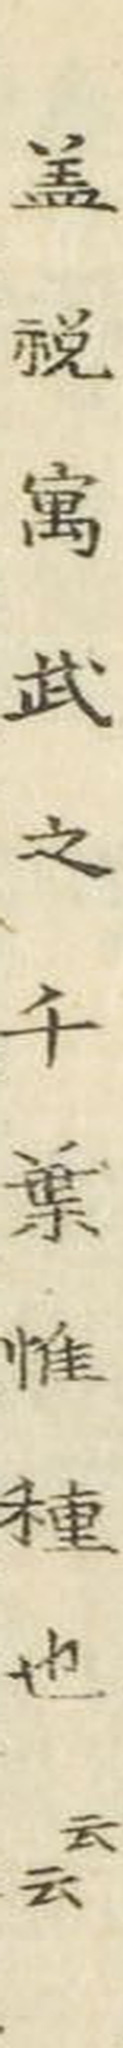蓋祱寓武之千葉惟種也云云
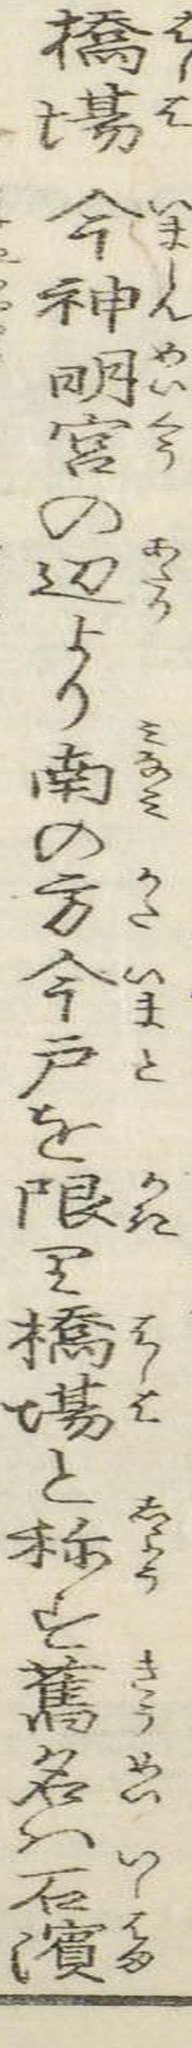橋場今神明宮の辺より南の方今戸を限り橋場と称す旧名は石浜
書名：江戸名所図会 20巻 巻之17
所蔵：東京学芸大学教育コンテンツアーカイブ
